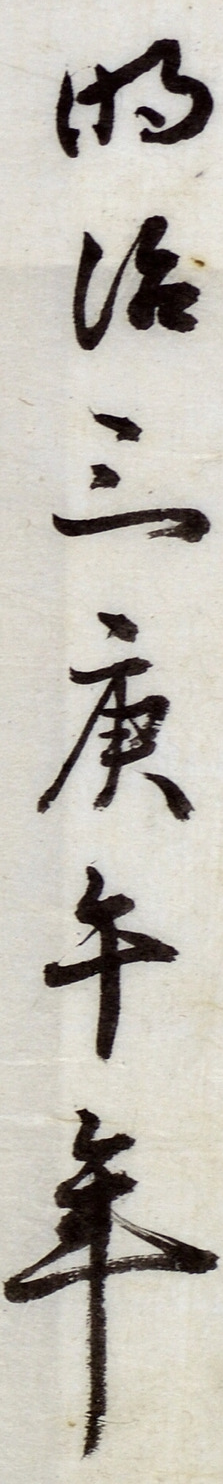明治三庚午年
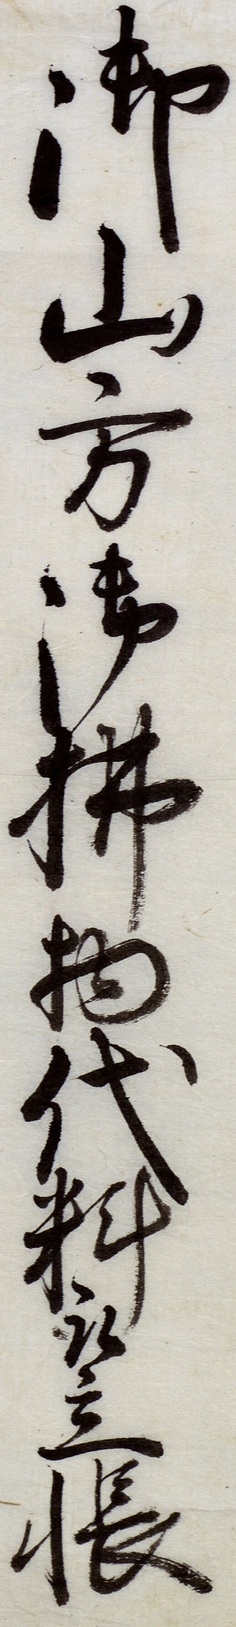御山方御払物代料取立帳
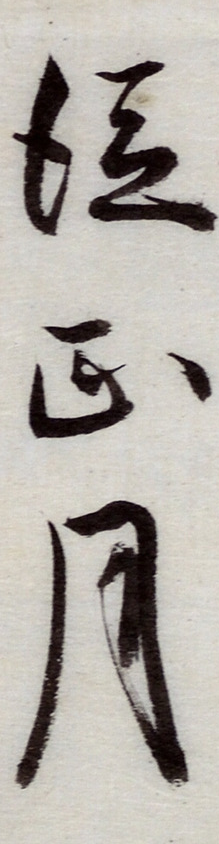従正月

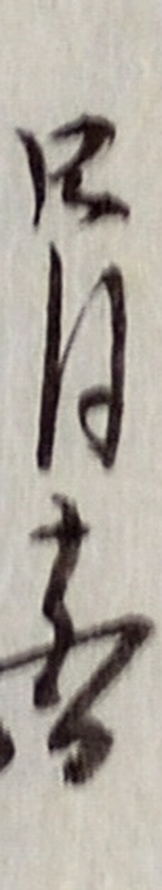四月十五日
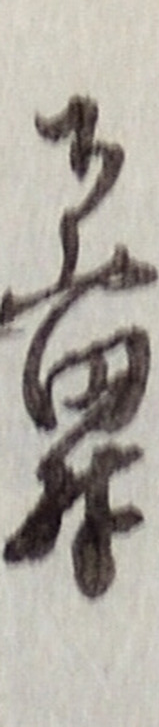下山田村
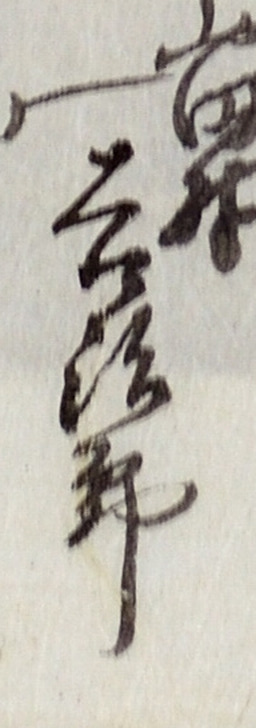吉治郎
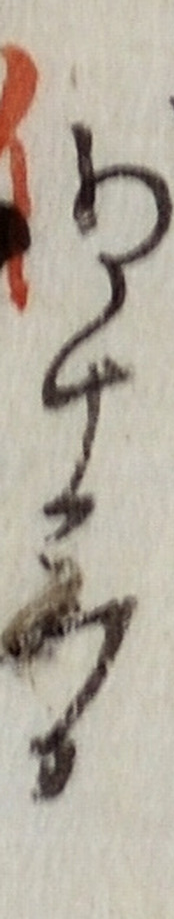卯十三日

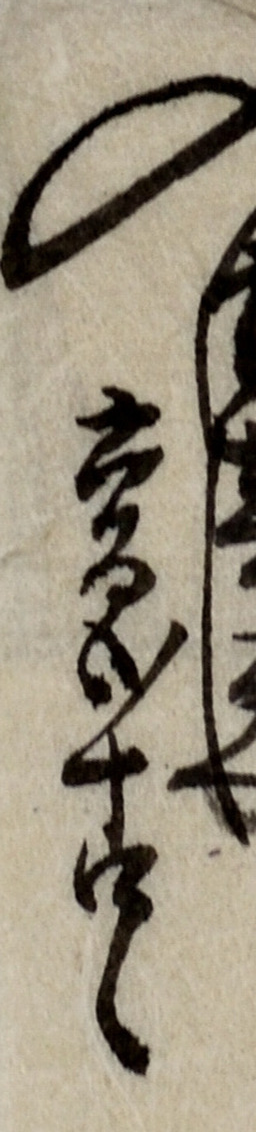六両弐十四日
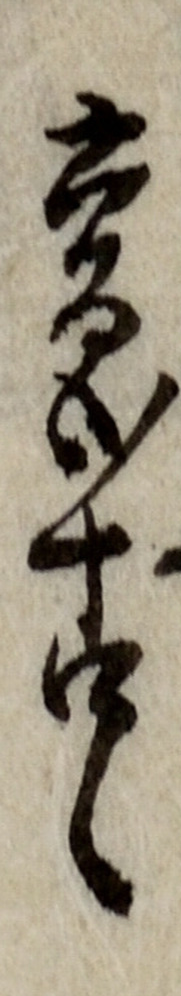六両弐十四日
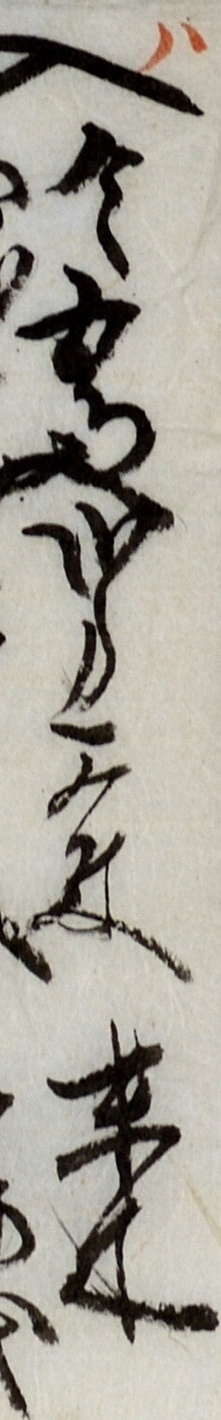入金五両弐分三朱栗木
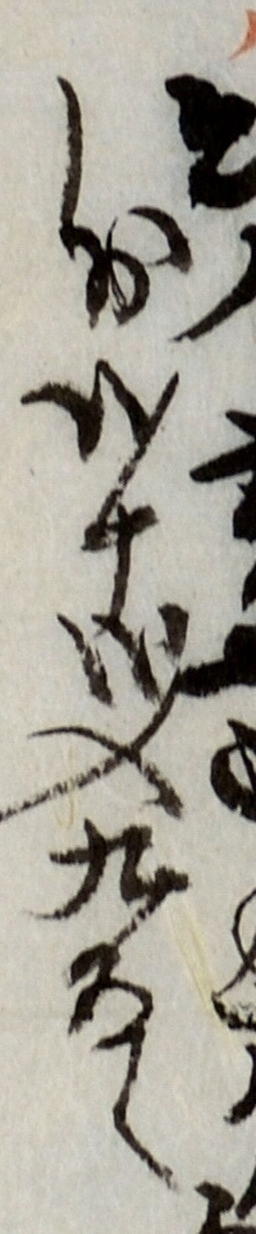外弐十弐〆九百文
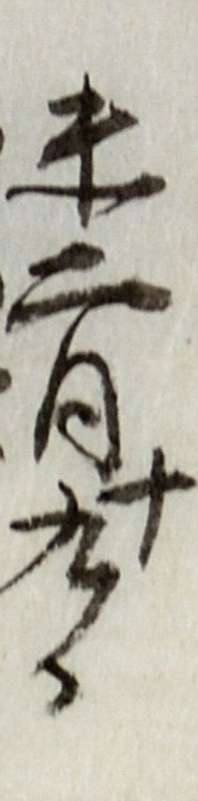△未二月十九日
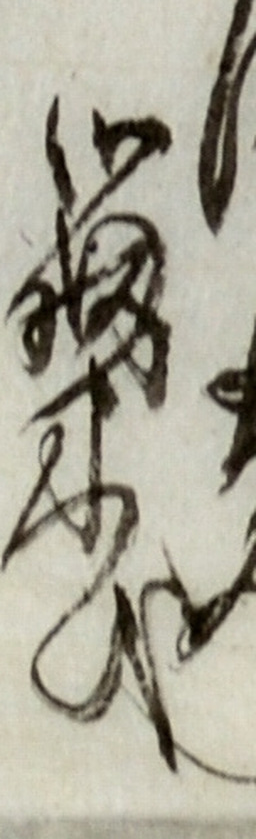御鍬木代

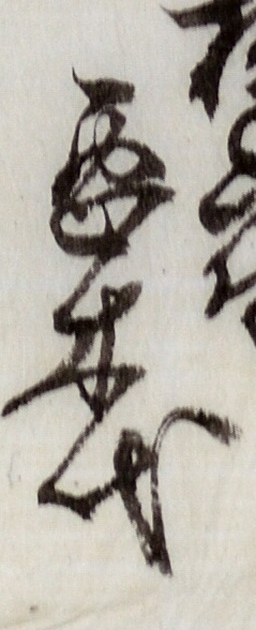栗木代
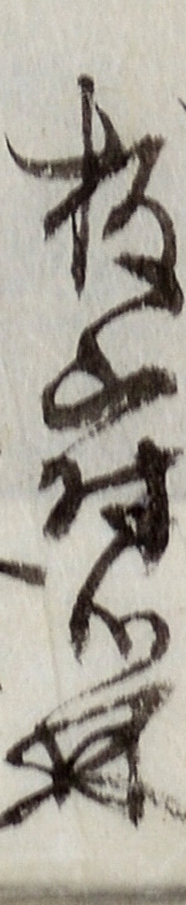板山村御林
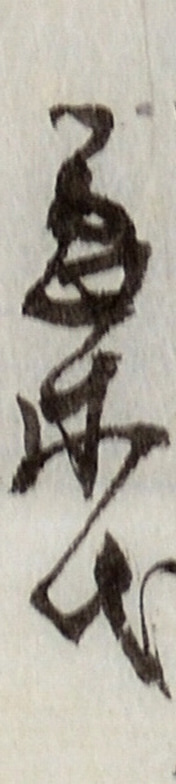栗木代
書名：御山方御拂物代料取立帳
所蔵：伊那市立高遠町図書館・合同会社AMANE
